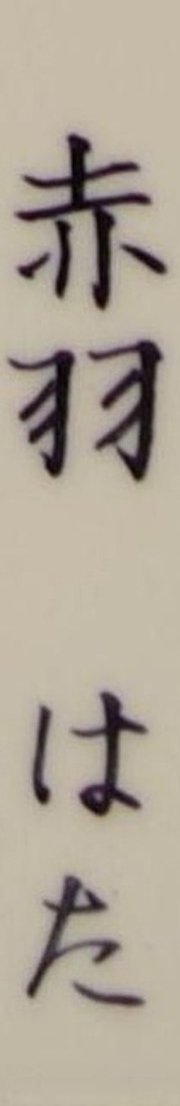赤羽はた
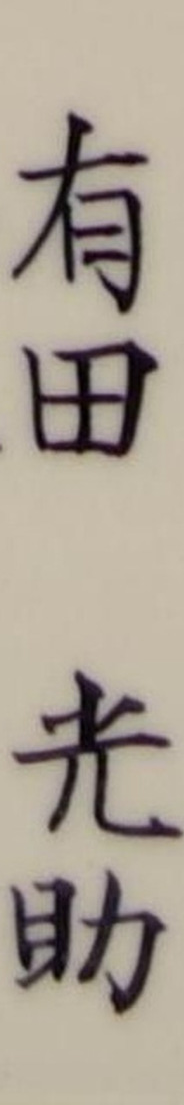有田光助
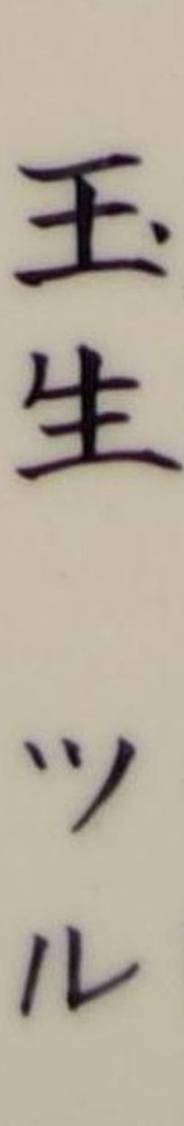玉生ツル
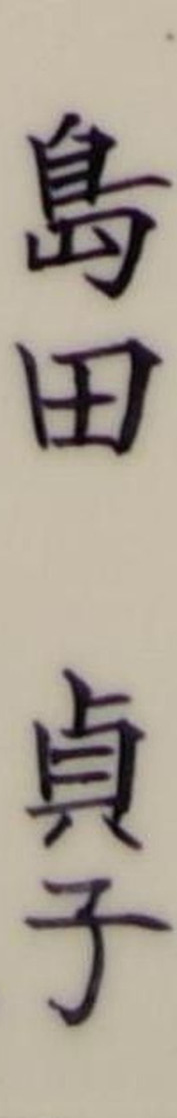島田貞子
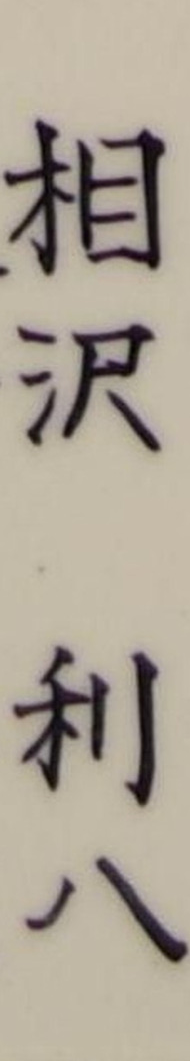相沢利八
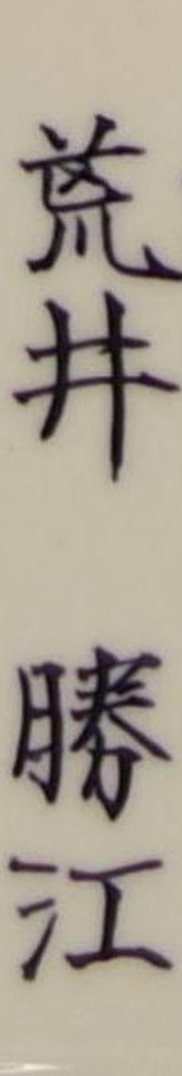荒井勝江
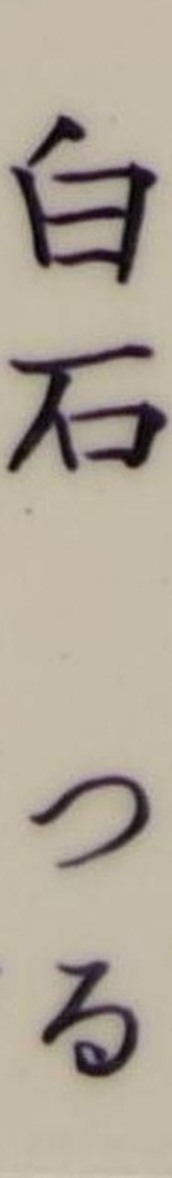白石つる
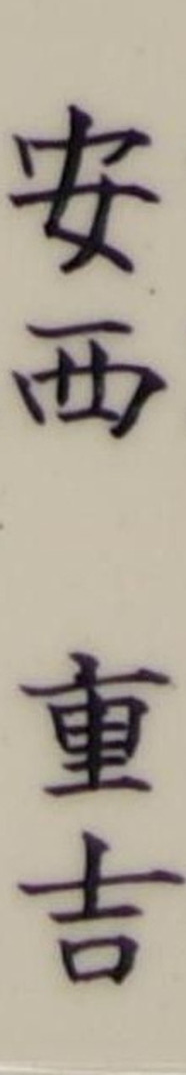安西重吉
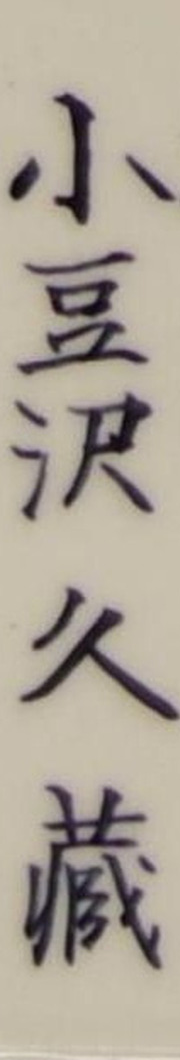小豆沢久蔵
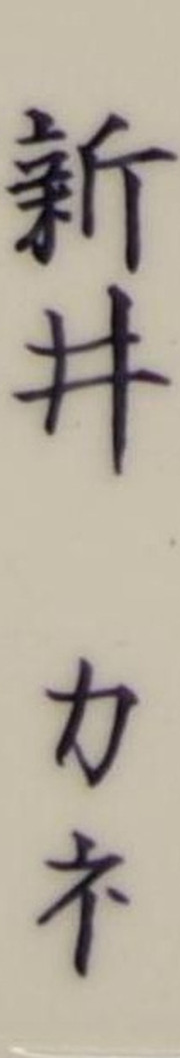新井カネ
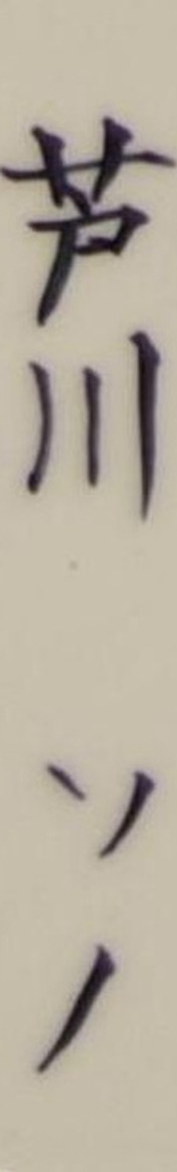芦川ソノ
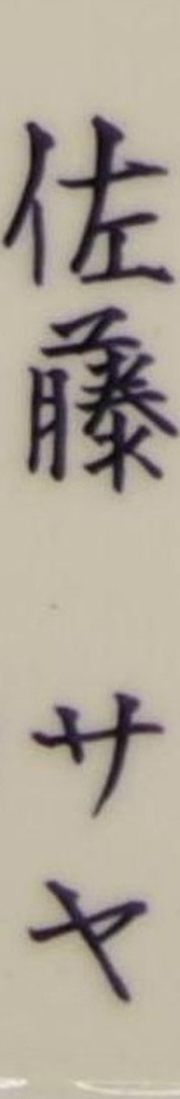佐藤サヤ
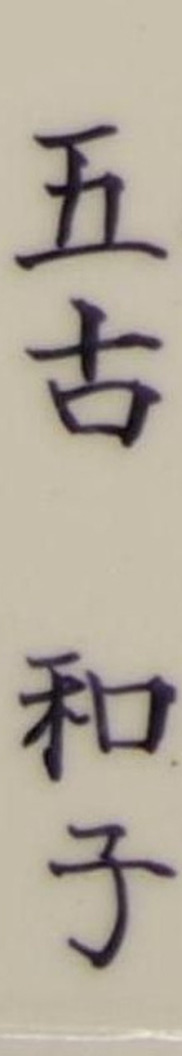五古和子
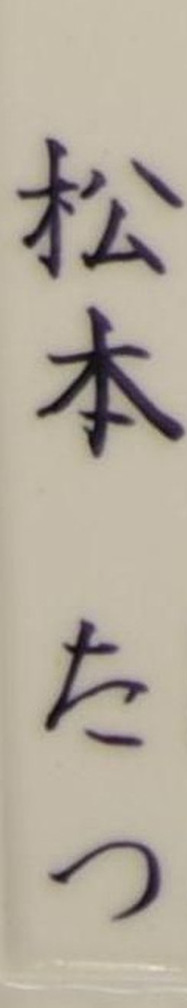松本たつ

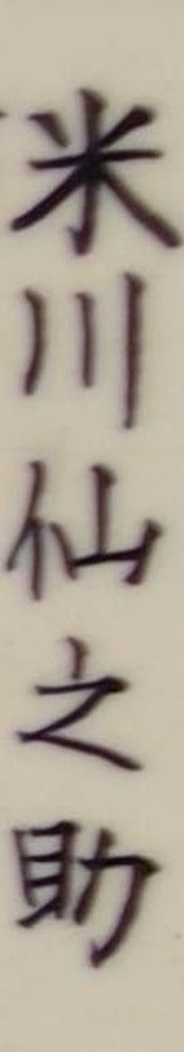米川仙之助
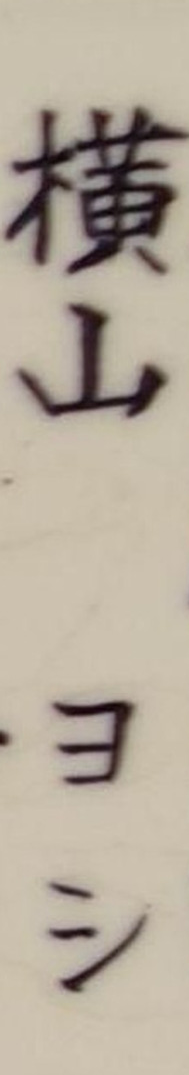横山ヨシ
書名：E~L
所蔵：高野山金剛峯寺
